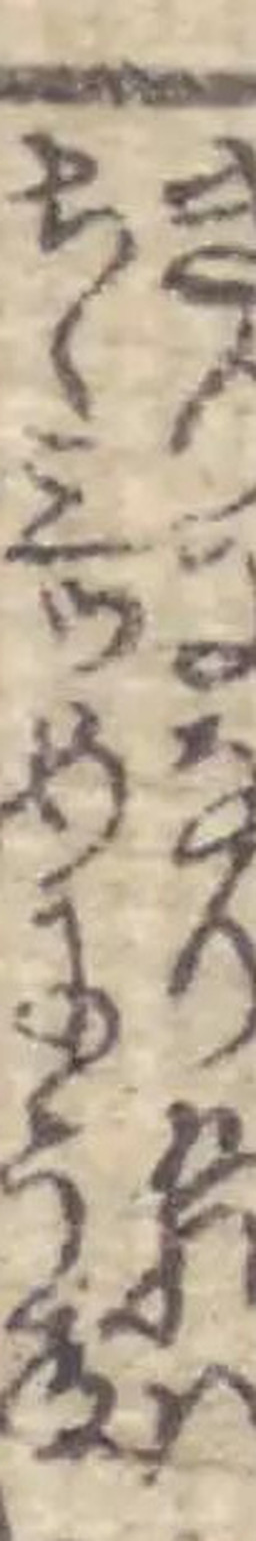ちゝ三っめにう道
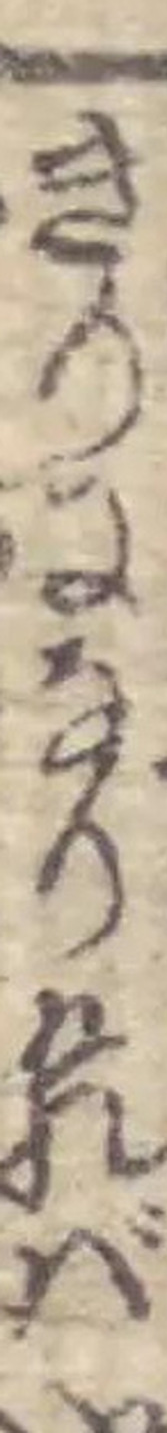きりになりければ
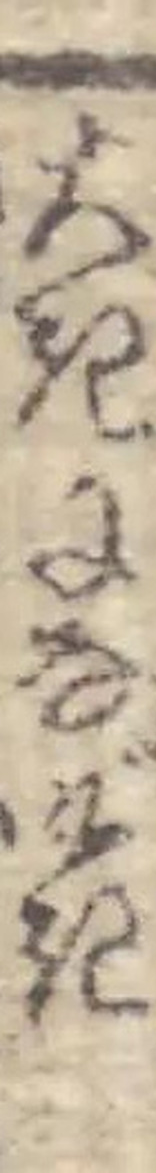大きになげき
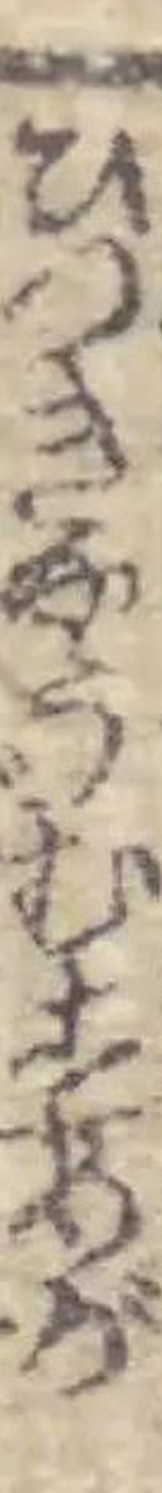ひつきやうむすめが
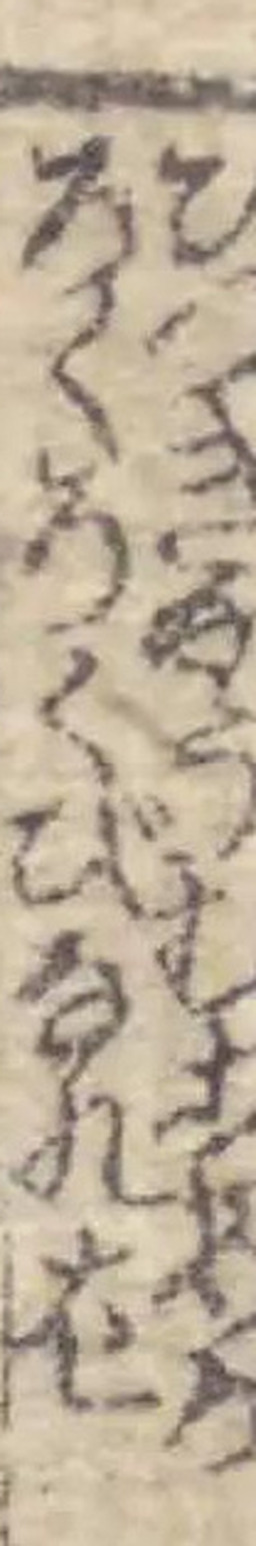ろくろくびになれば
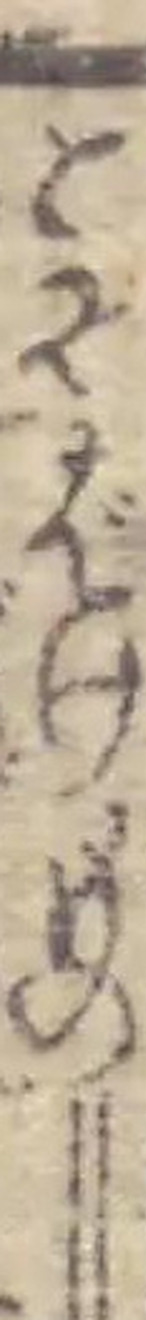こそばけもの
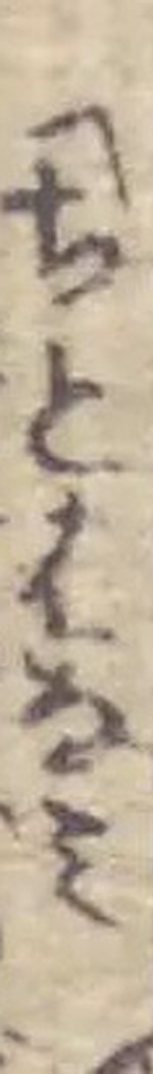〽ちとはなみ
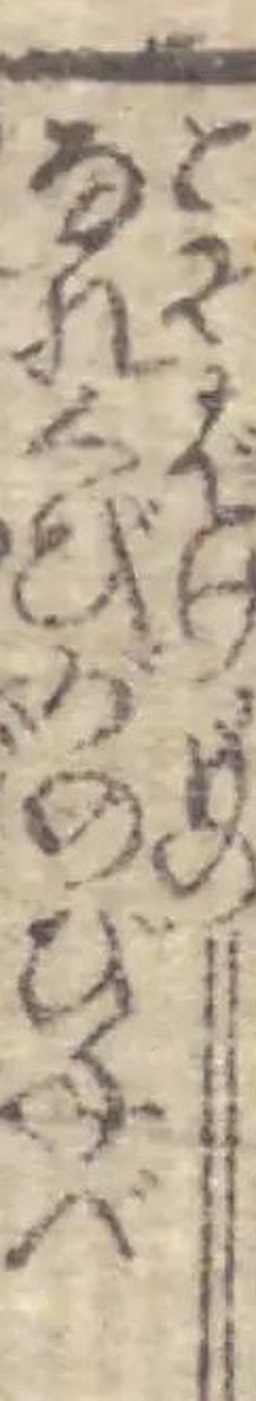なれくびがのびねば
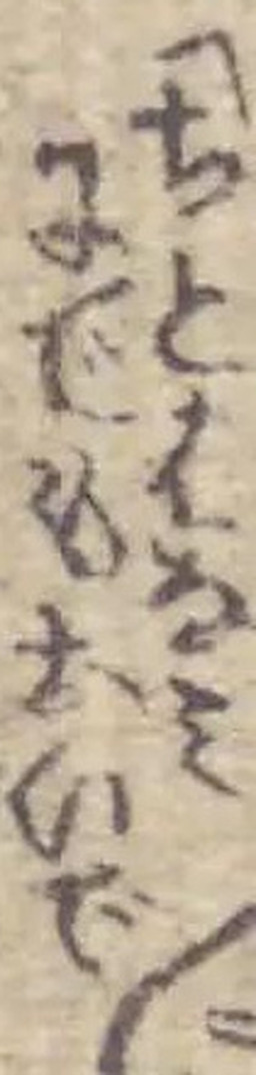にでもおいで
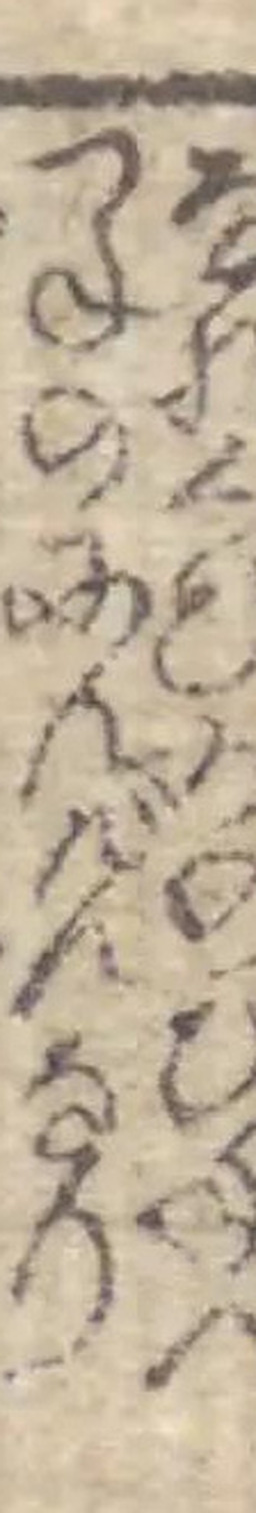つねのにんげんなり
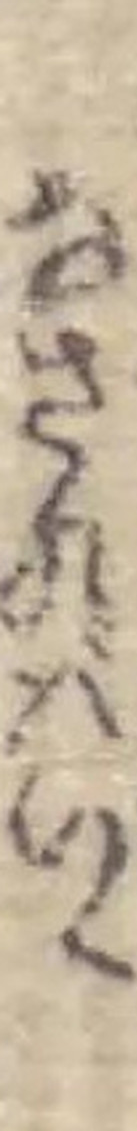なさればいゝ
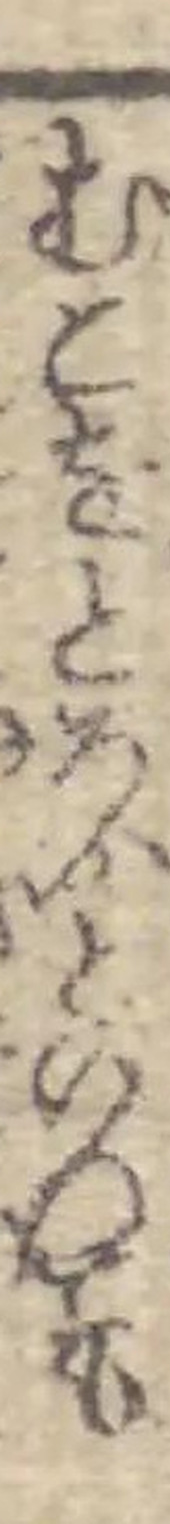むこをとろふといつても
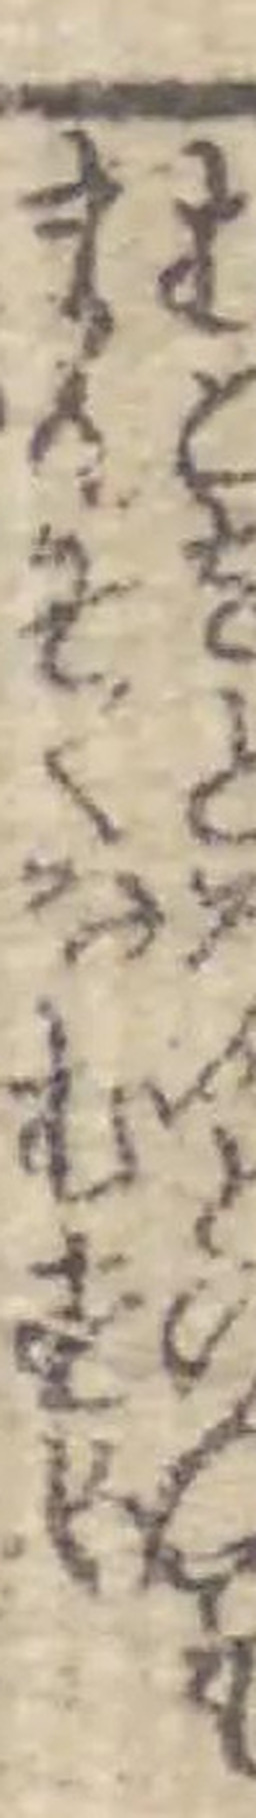まんぞくなむすめ
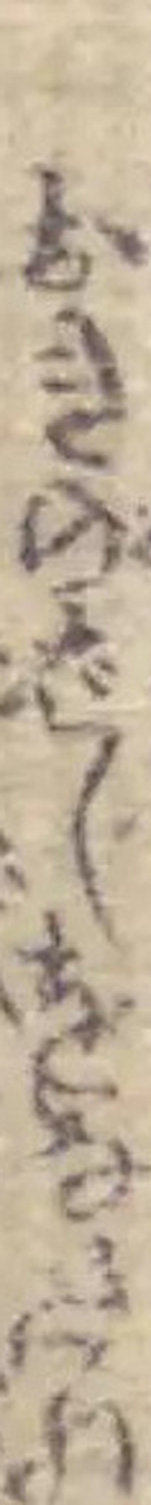おきのばしをなされ
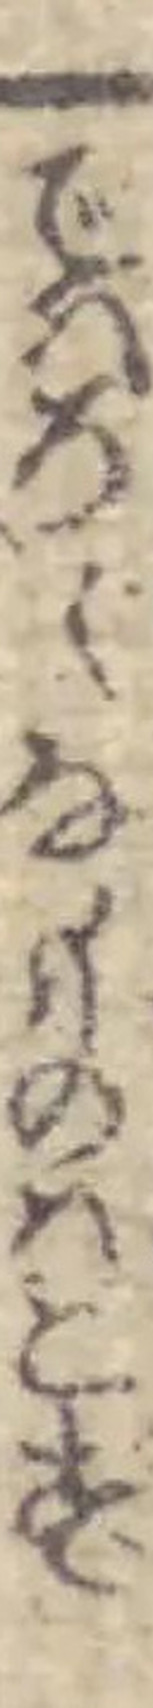ではろくなものはこず
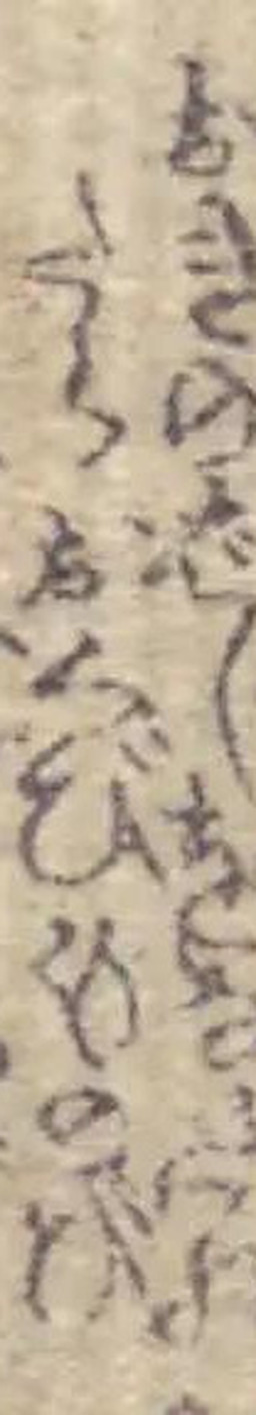たらおくびものび
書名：化物尽 4巻
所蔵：国立国会図書館 National Diet Library, JAPAN
